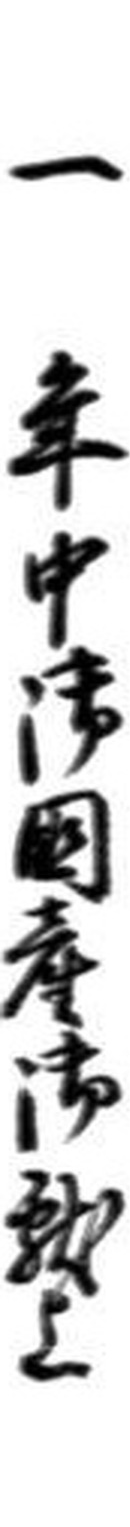一年中御国産御献上
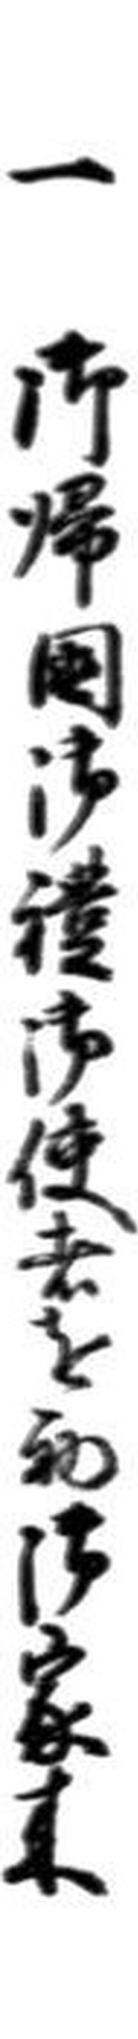一御帰国御礼御使者を初御家来

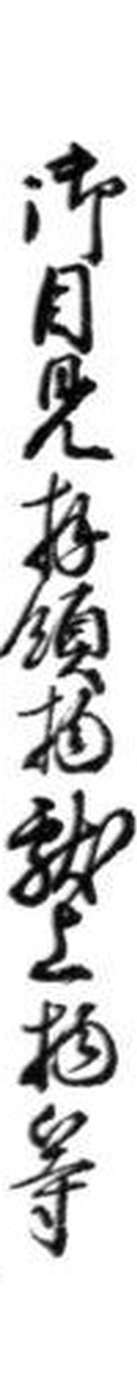御目見拝領物献上物等
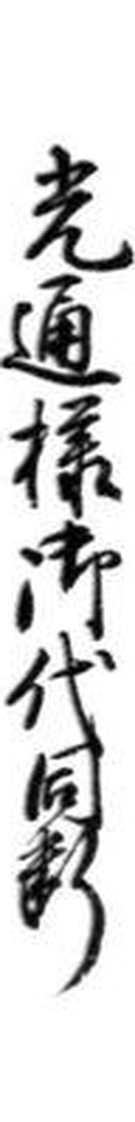光道様御代ｄ同断
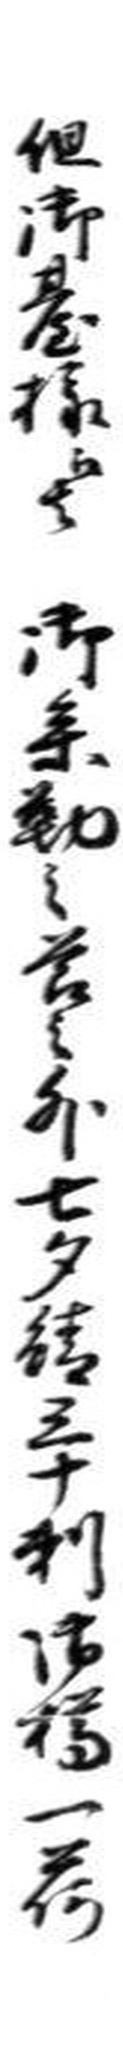但御臺様江者御参勤之節之外七夕鯖三十刺御樽一荷
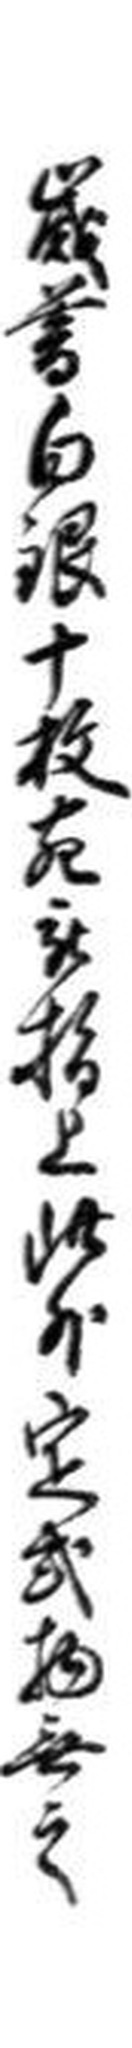歳暮白銀十枚宛被指上此外定式物無之
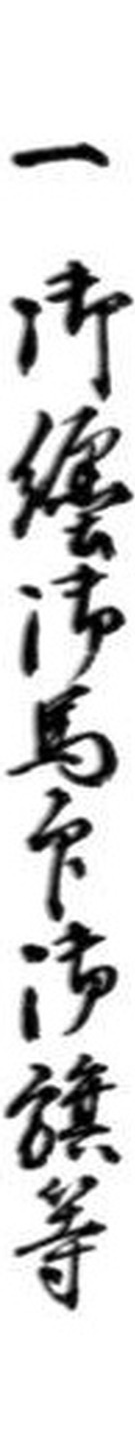一御纏御馬印御旗等
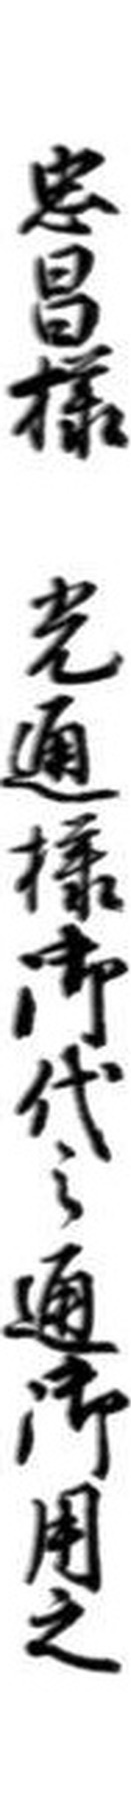忠昌様光通様御代之通御用之
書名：家譜 十一 昌親公 従延宝二年到延宝四年八月
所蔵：福井県文書館 Fukui Prefectural Archives
